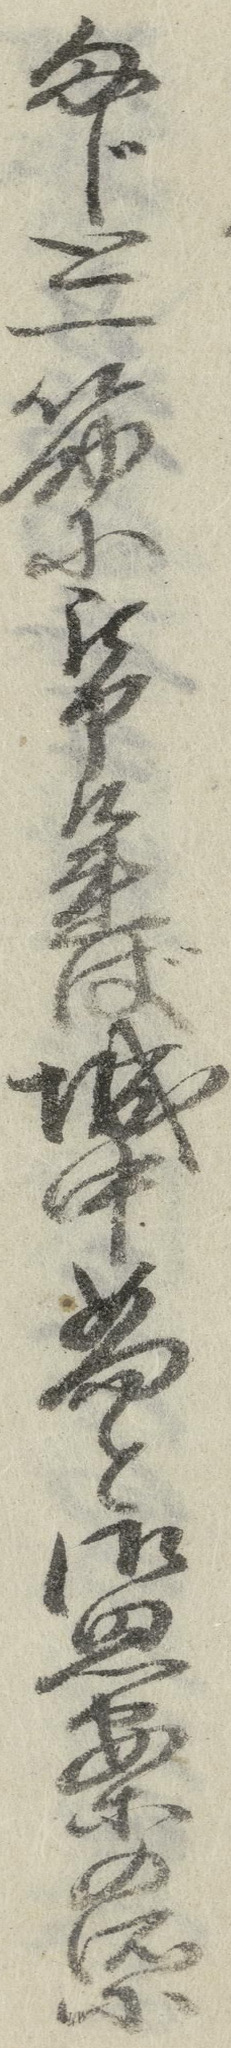まじと一筋に被申ければ城中如何と御思案の所に
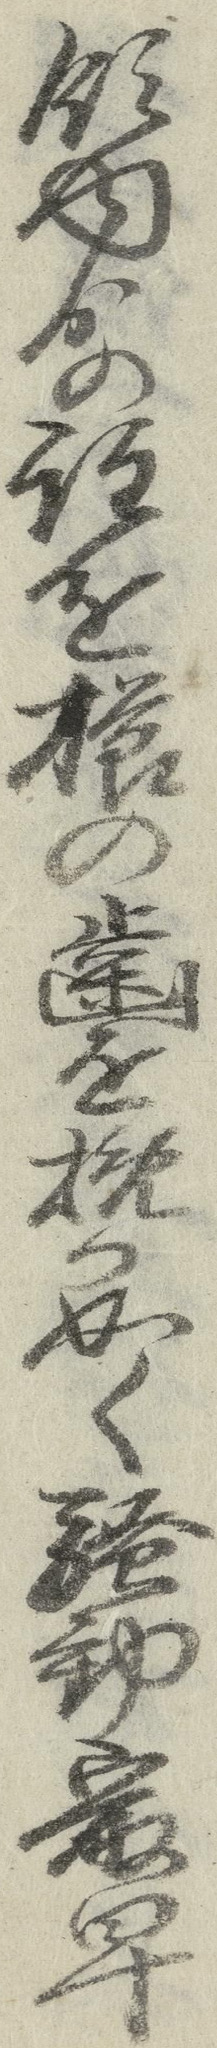領内ゟの注進櫛の歯を挽か如く騒動最早
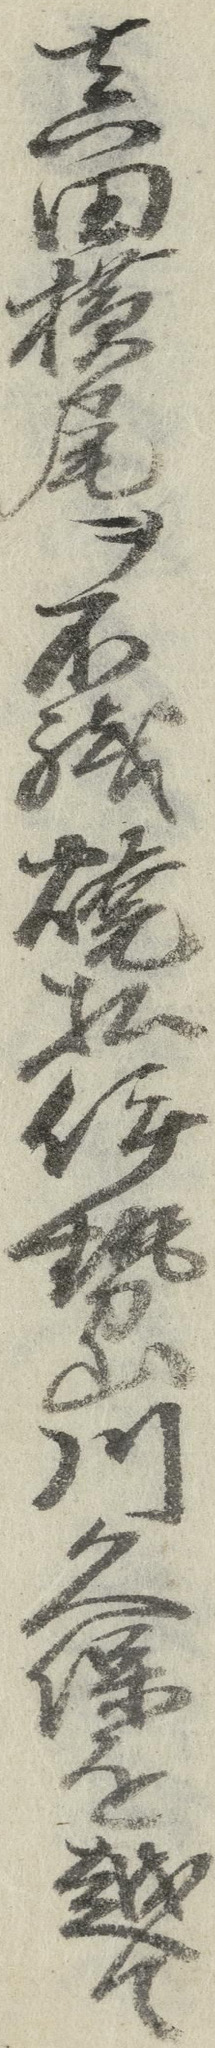真田横尾ヲ不残焼払伊勢山川久保を越て
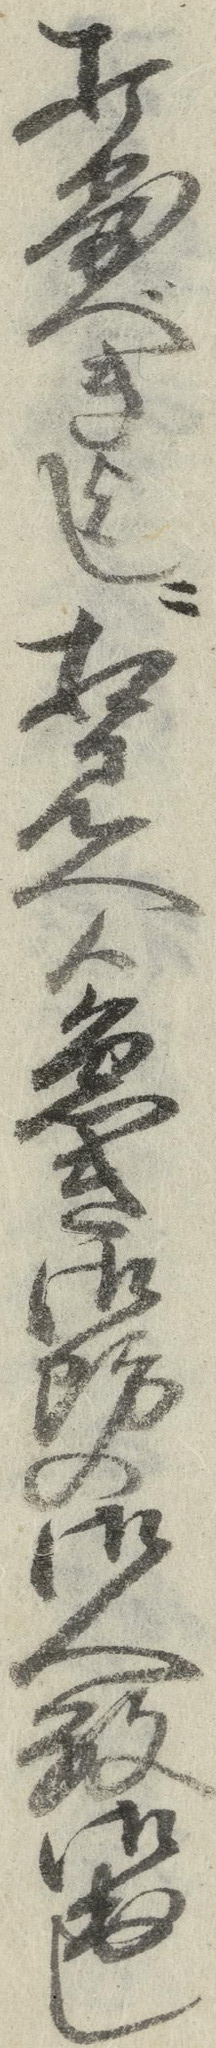打寄べきよしに相見へ候急き御防の御人数御出し
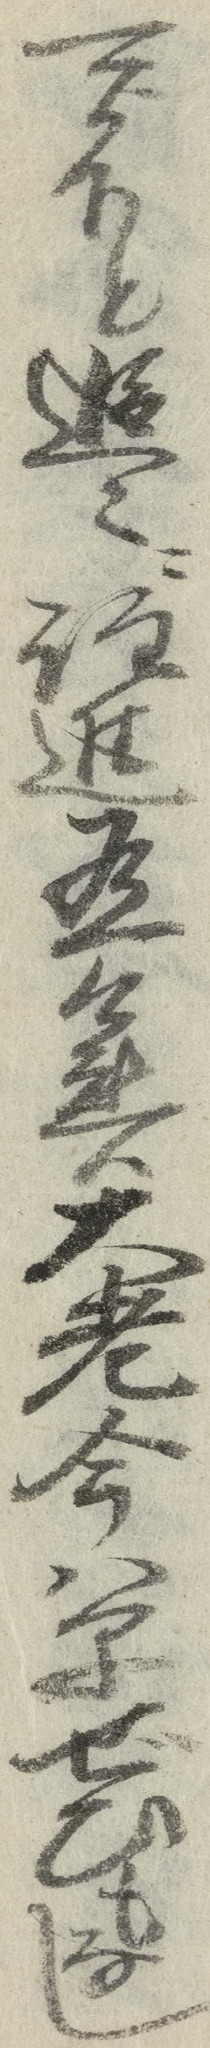可被下と追々に注進有けれは大老今は早ぜひもなし
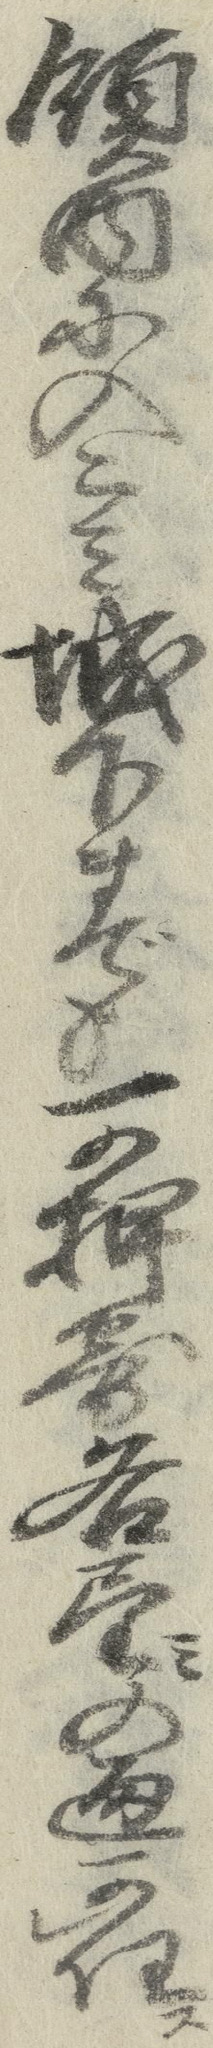領内に入こみ城下までも可押寄各望みの通可任

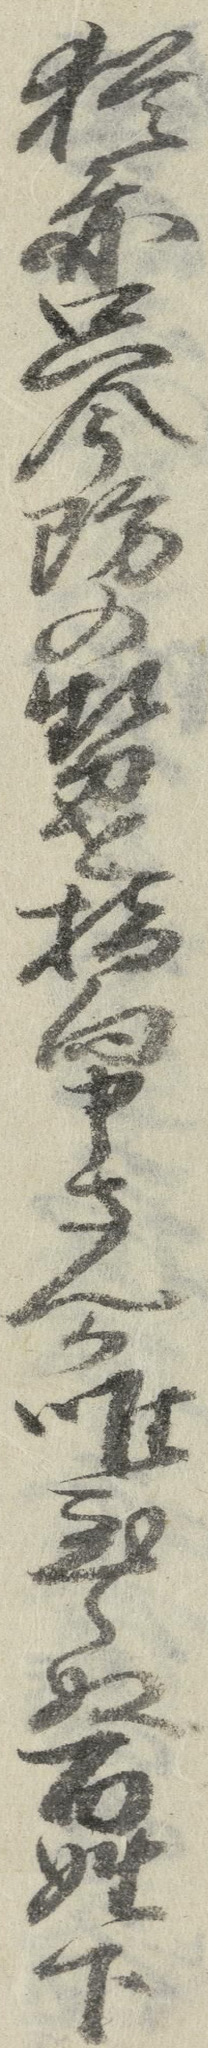猶亦只今防の勢を指向申さんか唯至らぬ百姓下
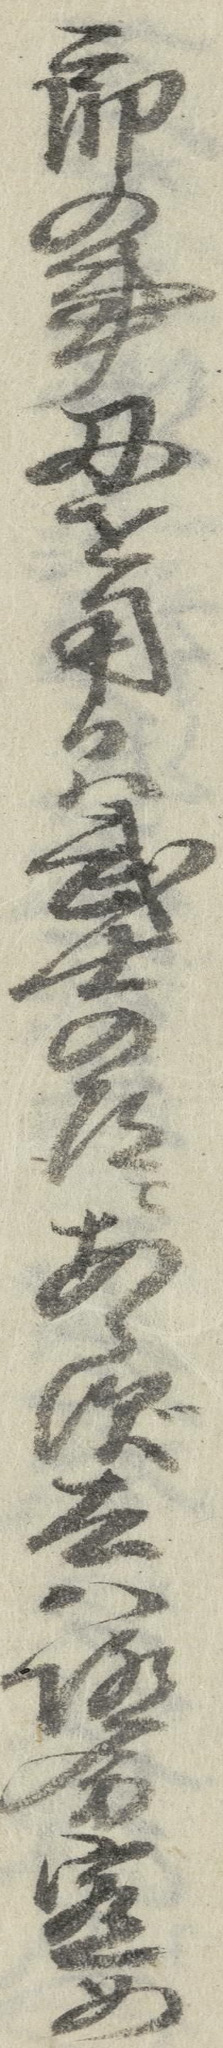郎の事刃を用るは武士の道にあらず去は随分宥め
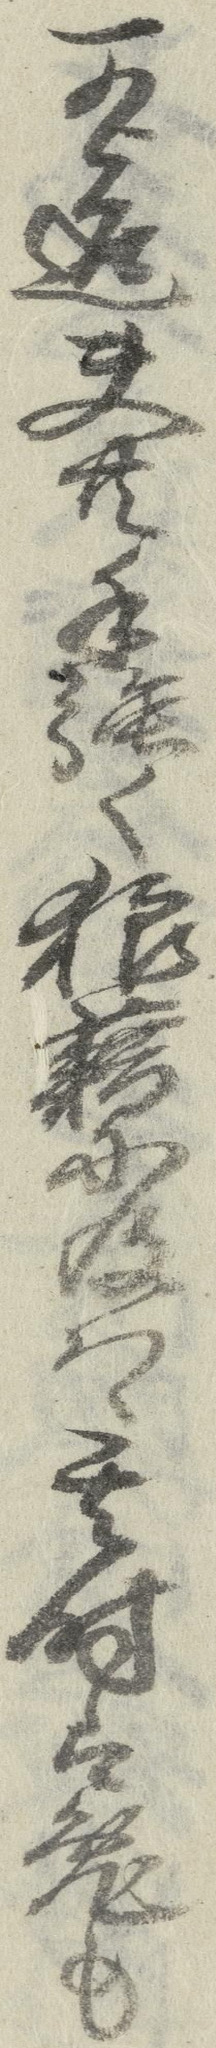可被返夫共手強く狼藉に及はゝ其時は兎も
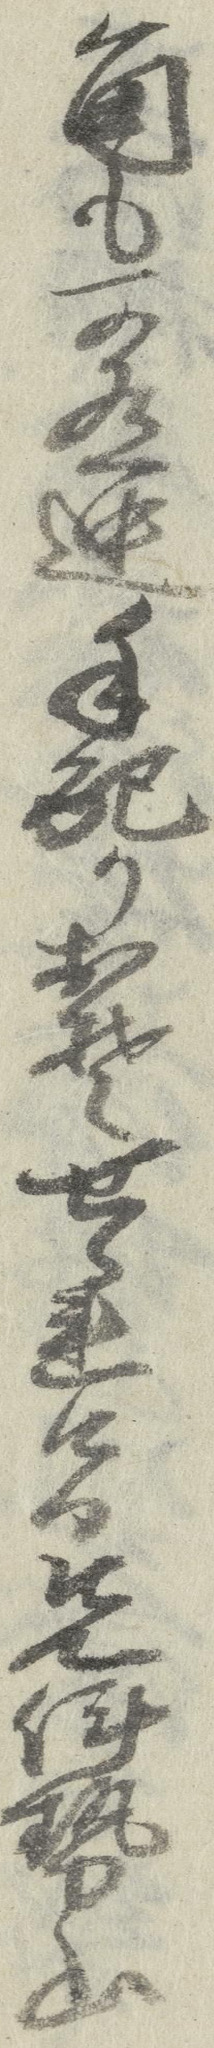角も可有迚手配りおそせられける先伊勢山
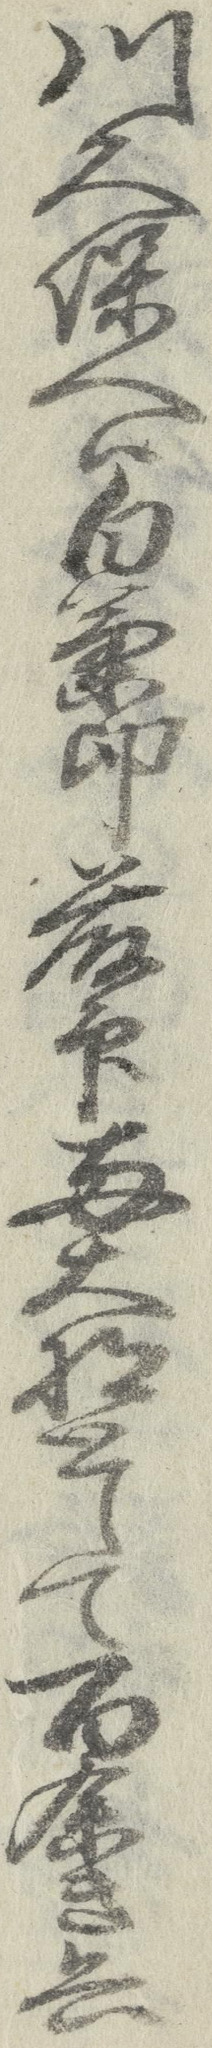川久保へは白菊印藤印両大将として百余き兵
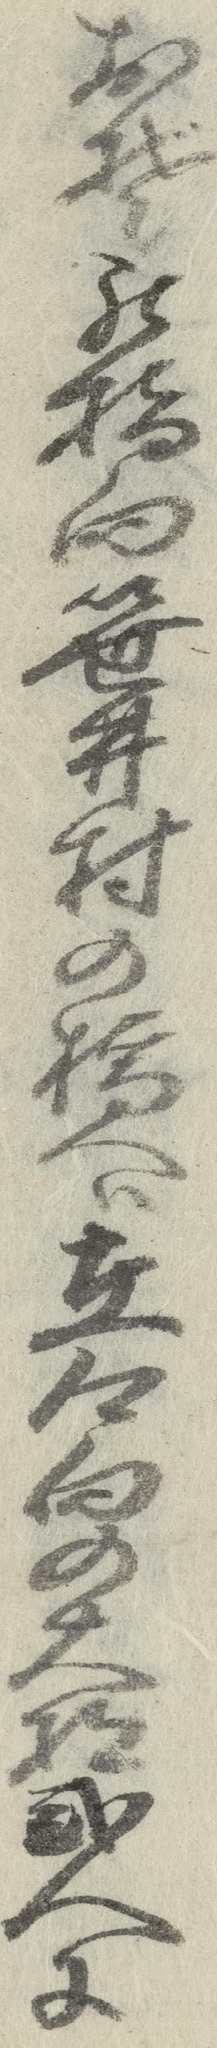おぞ被指向笹井村の橋へは在郷向の大将弐人に
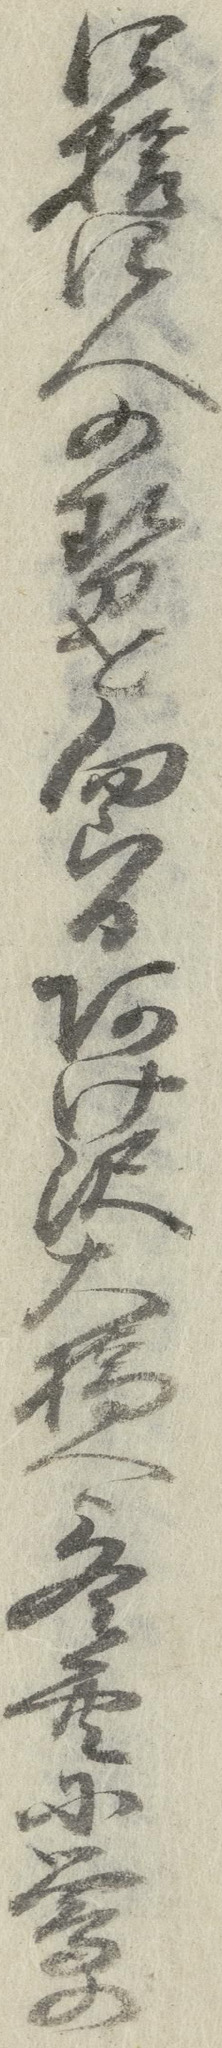四拾四人の勢を向らるあけ沢大橋へは冬空に鶯の
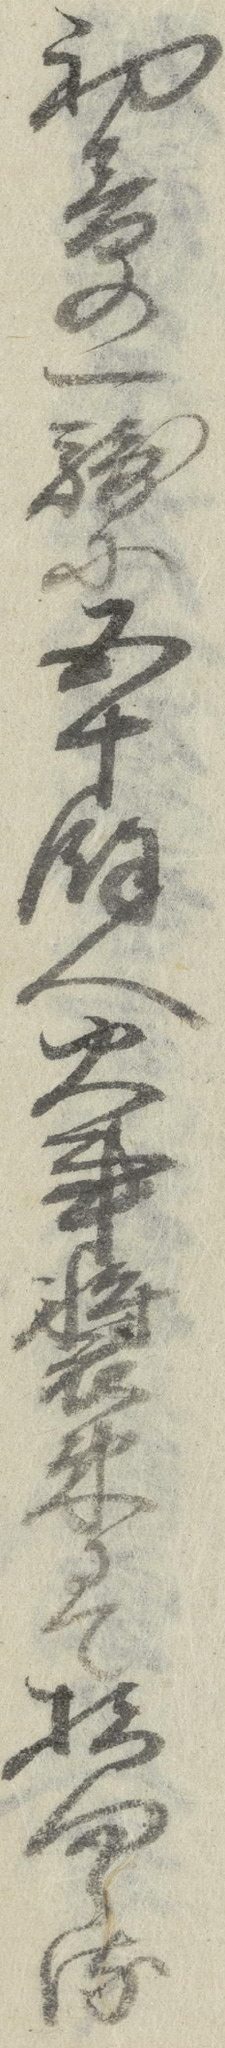初音の一騎に五十餘人火事装束にて指向らる
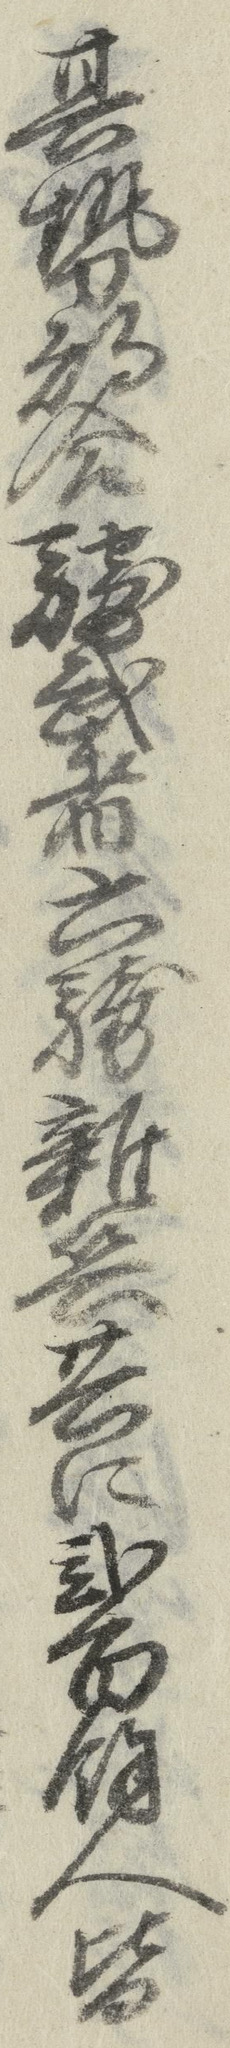其勢都合騎武者六騎雑兵共に弐百餘人皆
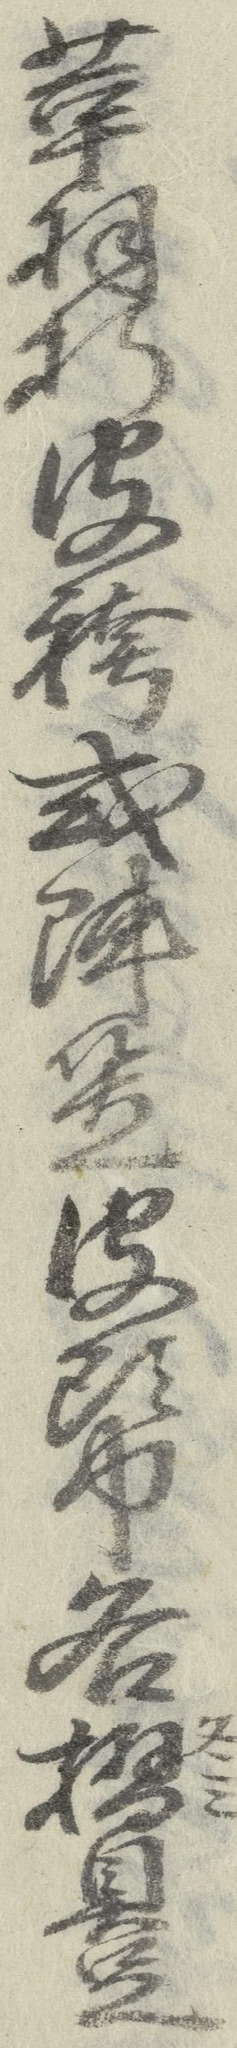革羽折皮袴或陣笠皮頭巾各摺具足
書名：浅間大焼騒動記　下
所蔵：東京大学地震研究所図書室 Earthquake Research Institute Library, The University of Tokyo, JAPAN
